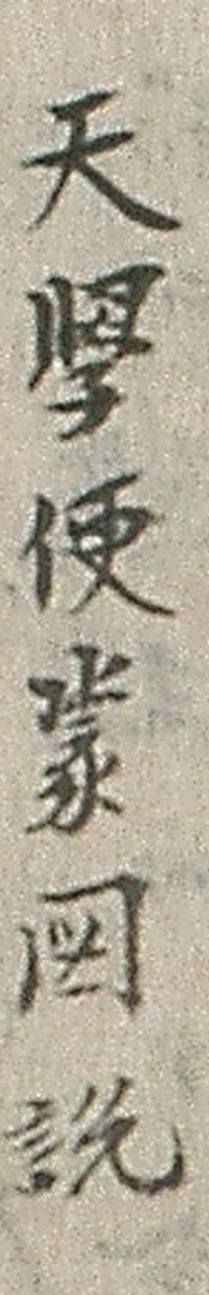天學便蒙図説
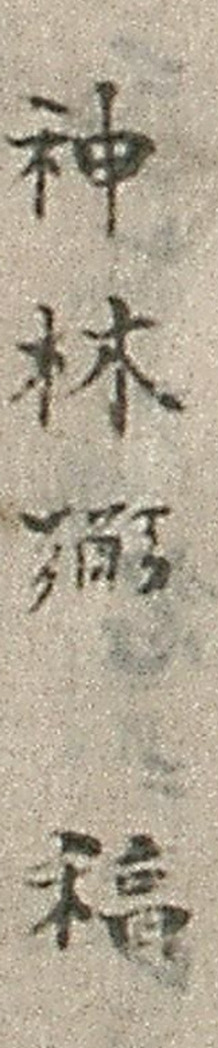神林弼稿
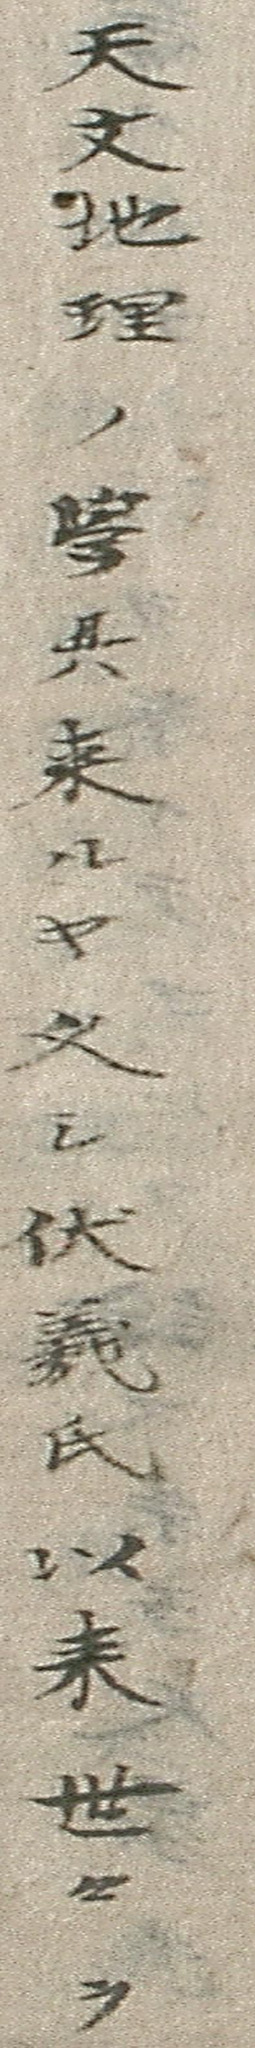天文地理ノ学其来ルヤ久シ伏義氏以来世々ヲ
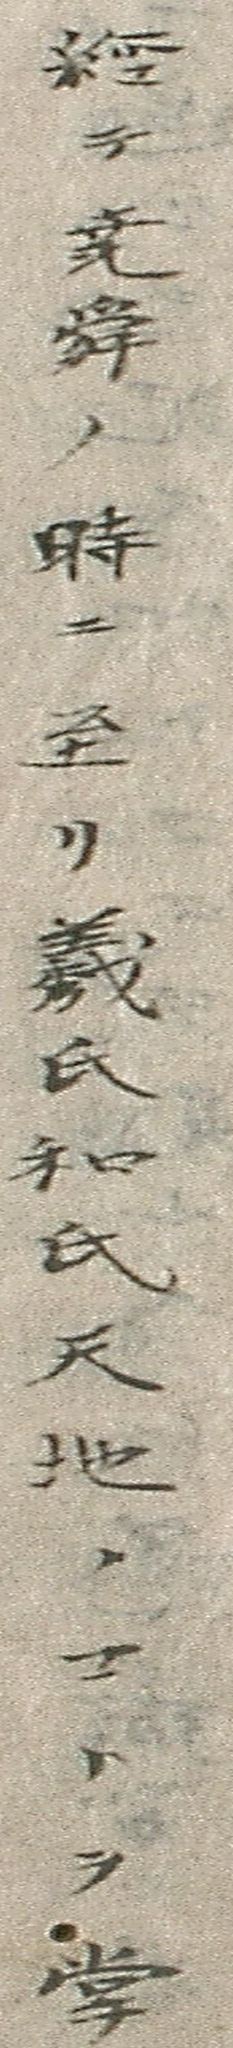経テ尭舜ノ時ニ至リ義氏和氏天地ノコトヲ掌
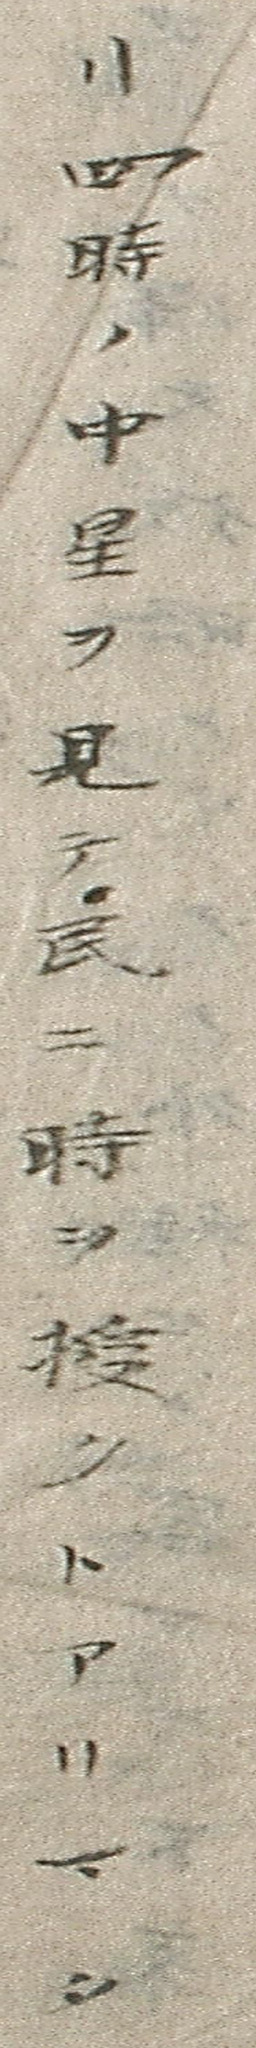リ四時ノ中星ヲ見テ民ニ時ヲ授クトアリマタ
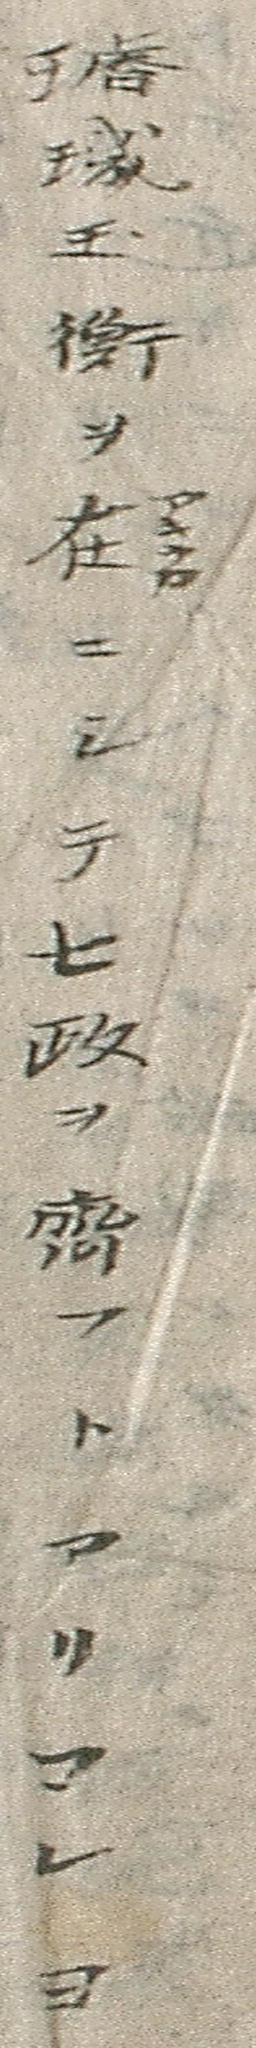璿珹玉衡ヲ在ニシテ七政を齊フトアリコレヨ
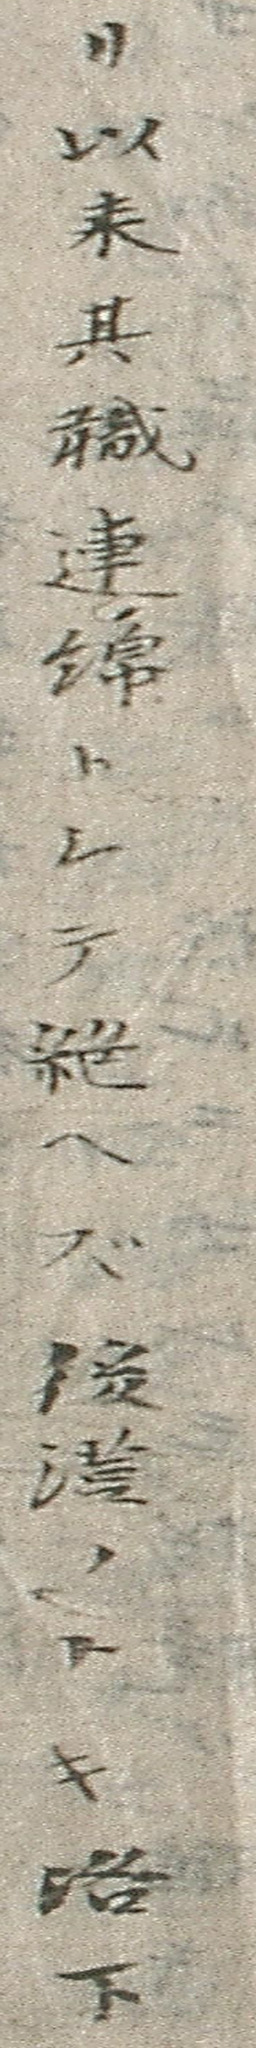リ依頼其職連綿トシテ絶ヘズ後濫ノトキ洛下
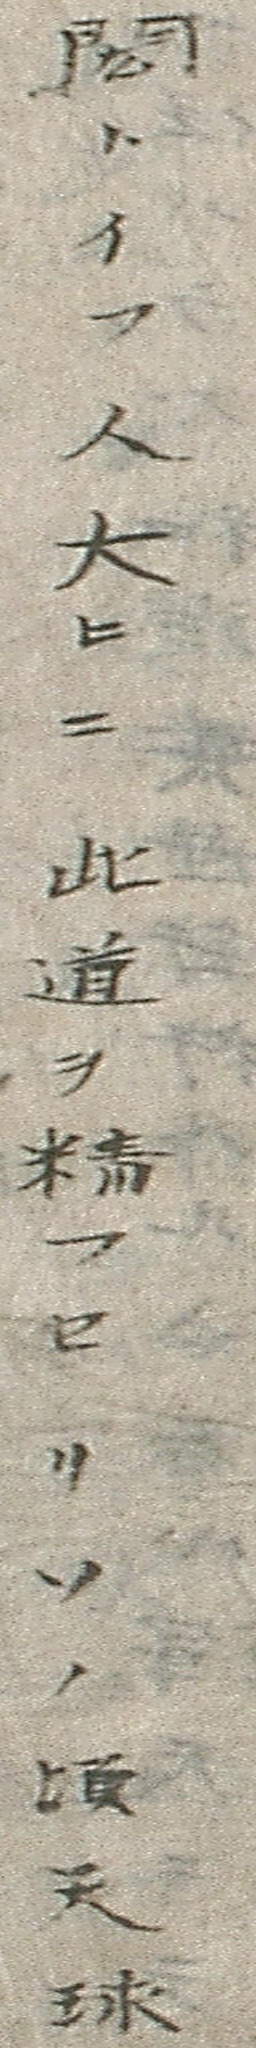閎トイフ人大ヒニ此道ヲ精フセリソノ頃天球
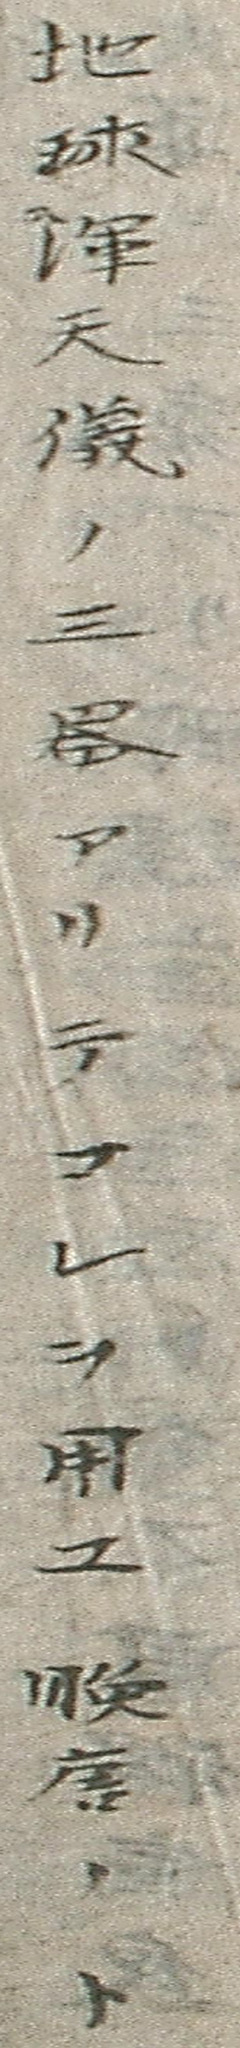地球渾天儀ノ三器アリテコレヲ用ユ晩唐ノト
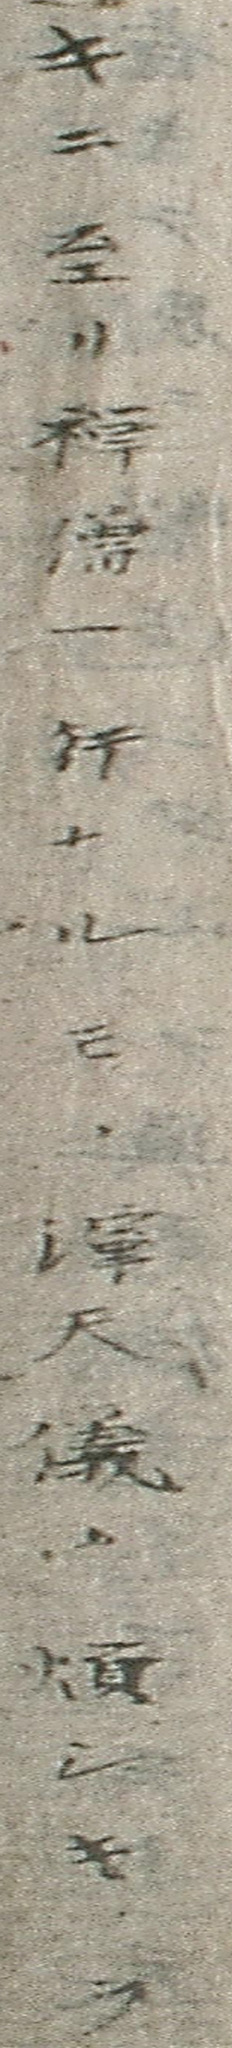キニ至リ釈僧一行ナルモノ渾天儀ノ煩シキヲ

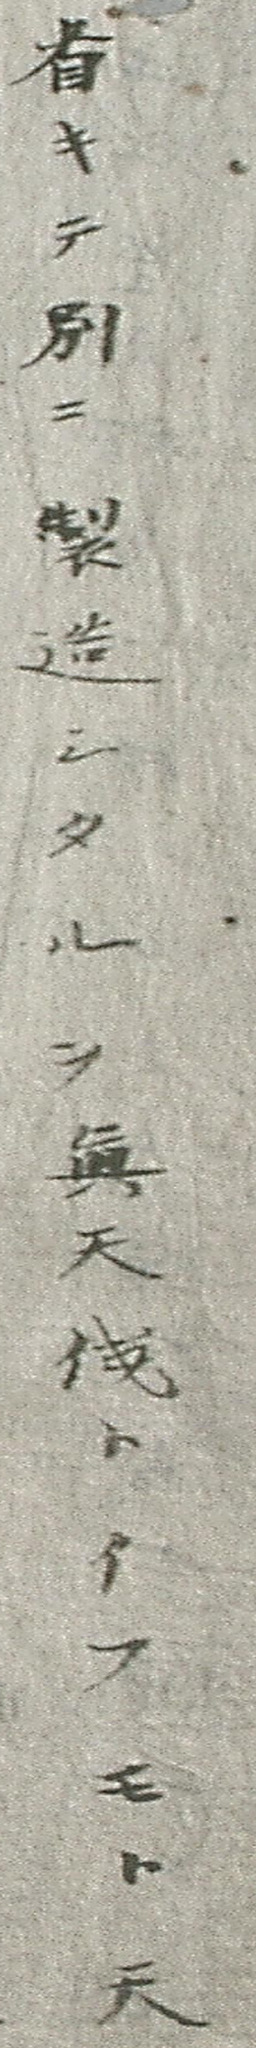省キテ別ニ製造シタルヲ眞天儀トイフモノ天
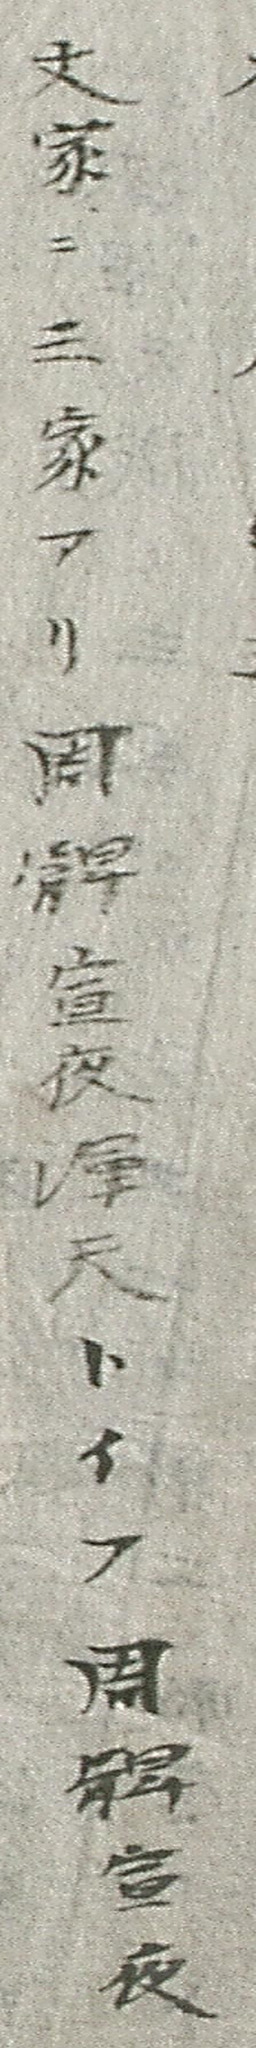文家ニ三家アリ周髀宣夜渾天トイフ周髀宣夜
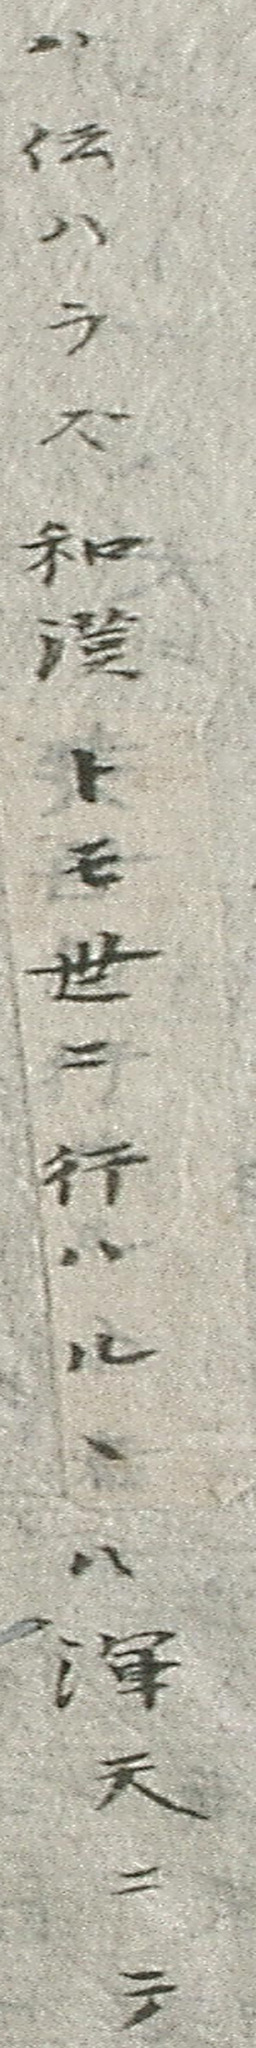ハ伝ハラズ和濫トモ世ニ行ハルヽハ渾天ニテ
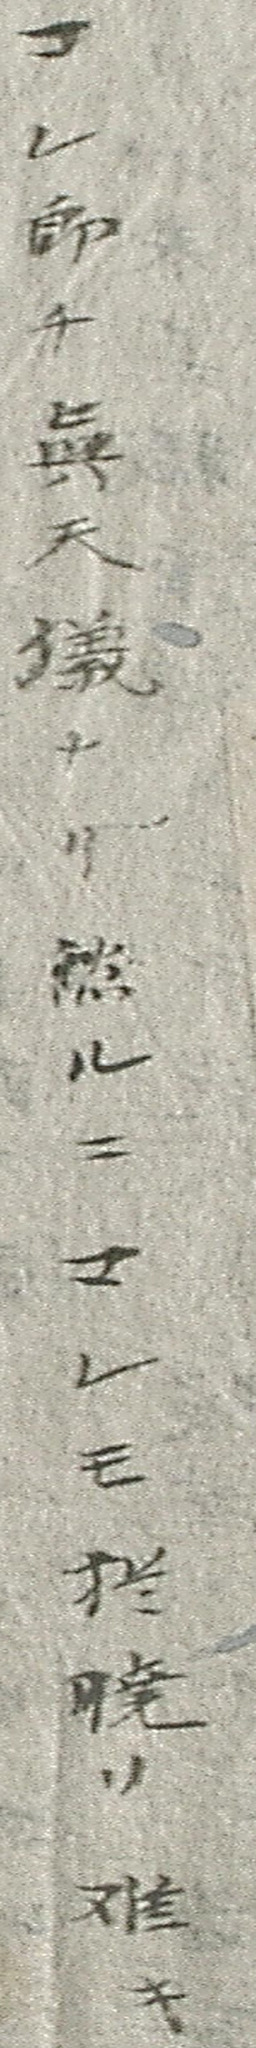コレ即チ眞天儀ナリ然ルニコレモ猶暁リ碓キ
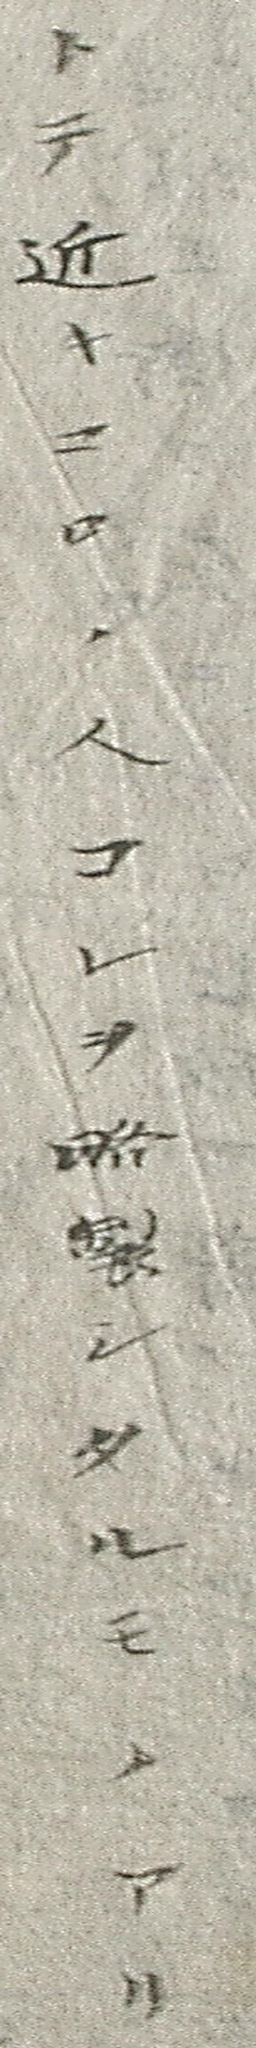トテ近キコロノ人コレヲ略製シタルモノアリ
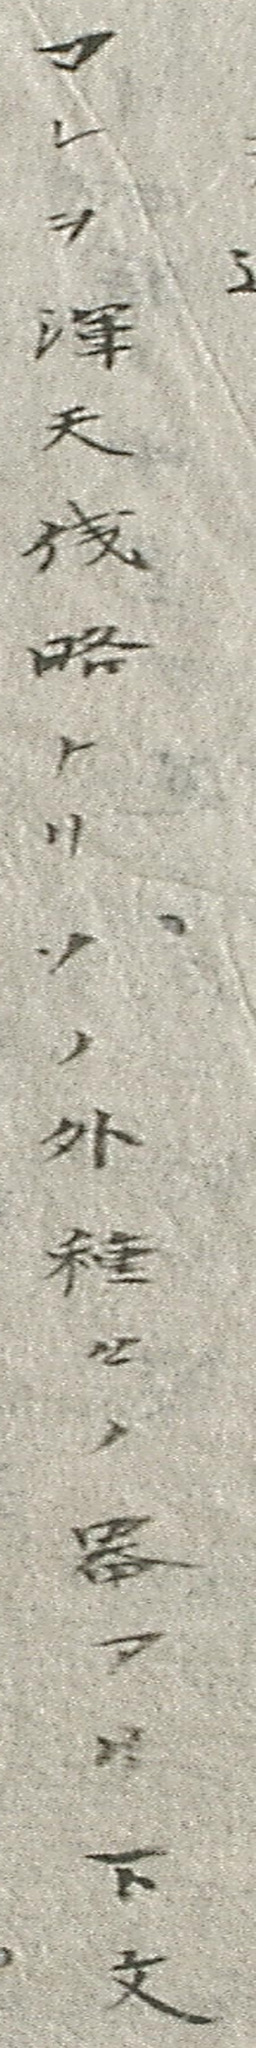コレヲ渾天儀略ナリソノ外種々ノ器アリ下文
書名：天學便蒙図説
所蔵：東京大学地震研究所図書室 Earthquake Research Institute Library, The University of Tokyo, JAPAN
